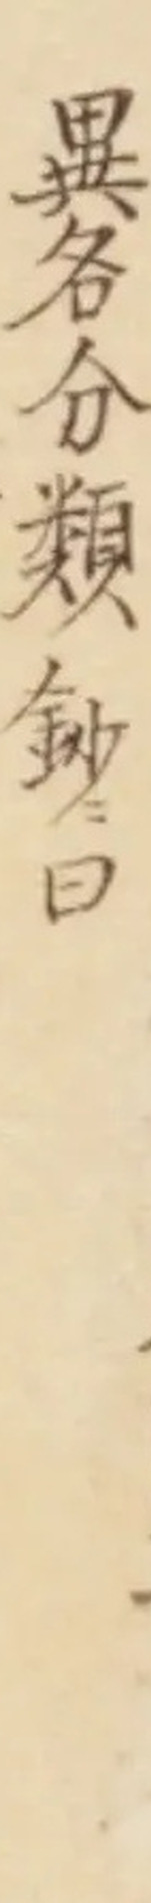異名分類抄ニ曰
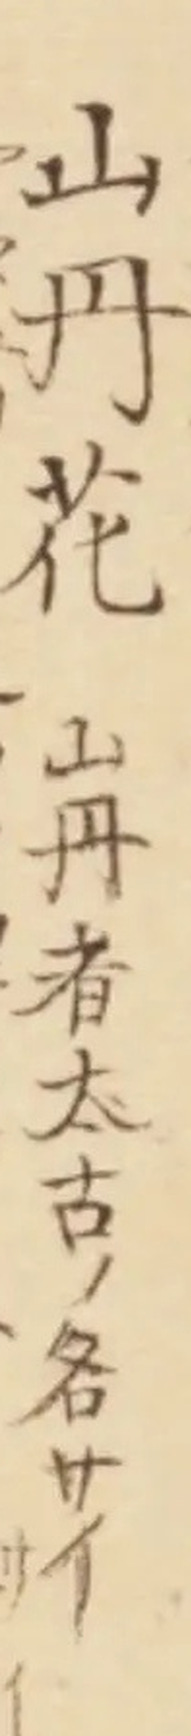山丹花山丹者太古ノ名サイ
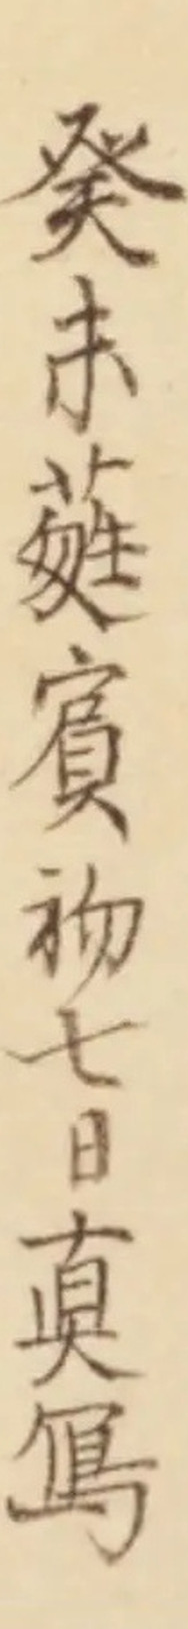癸未蕤賓初七日真寫
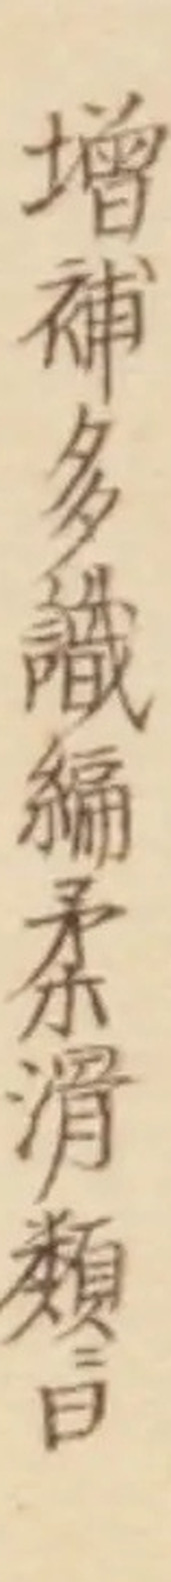増補多識編柔滑類ニ曰
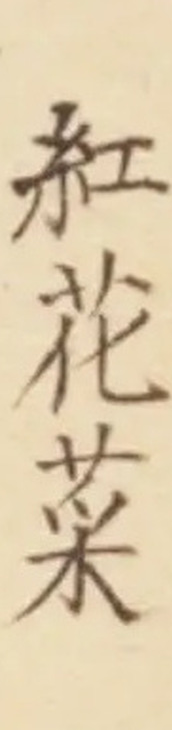紅花菜

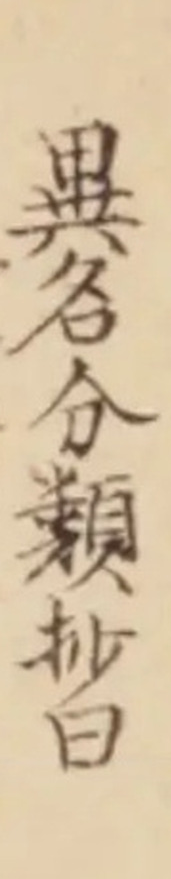異名分類抄曰
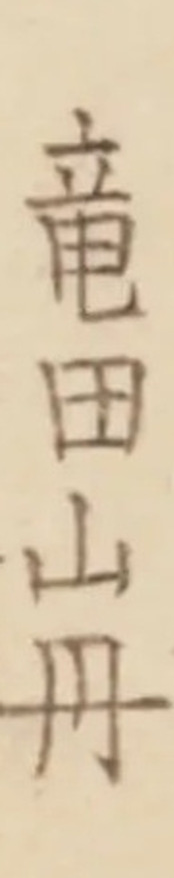竜田山丹
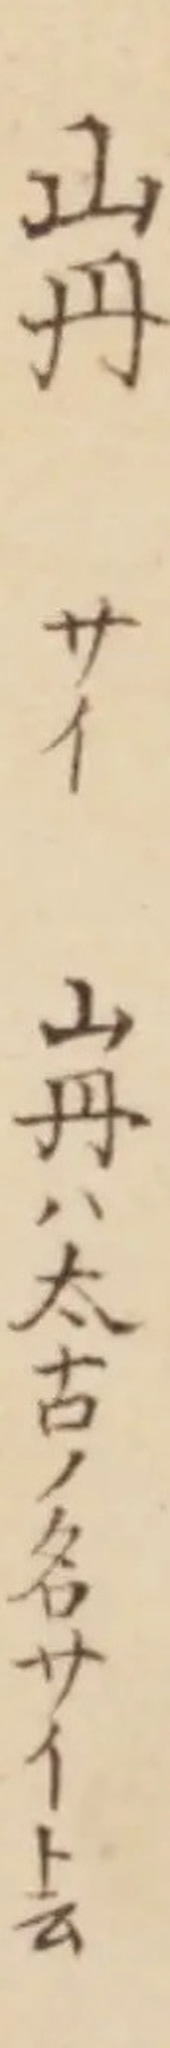山丹サイ山丹ハ太古ノ名サイト云
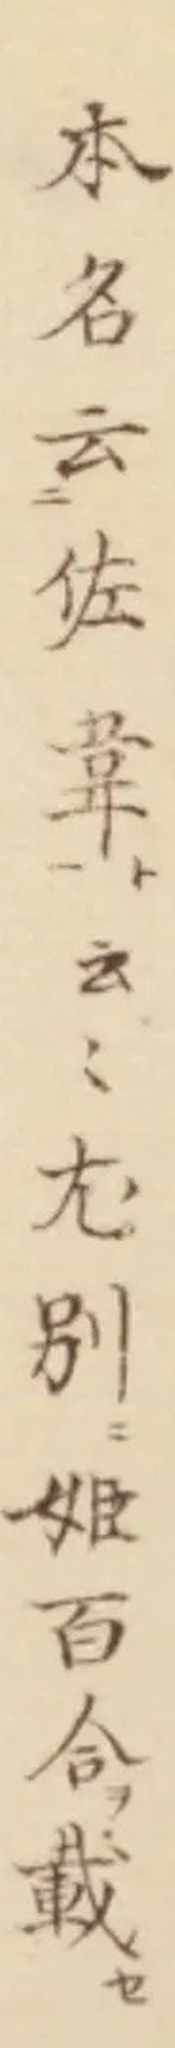本名云佐韋ト云々尤別ニ姫百合ヲ載セ
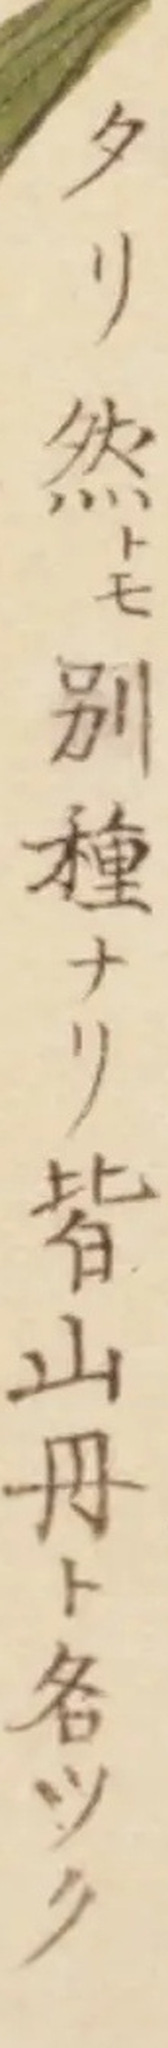タリ然トモ別種ナリ皆山丹ト名ツク
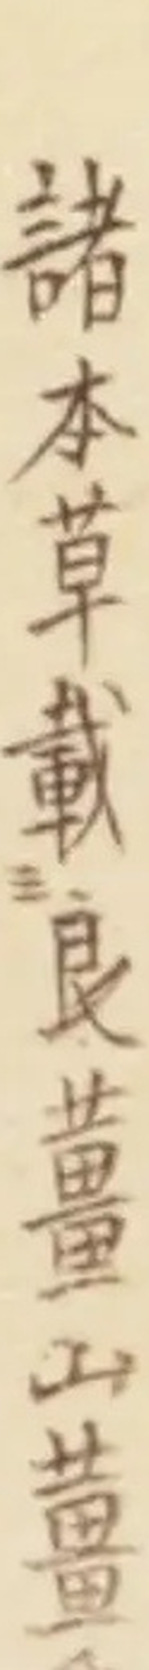諸本草載良薑山薑爲
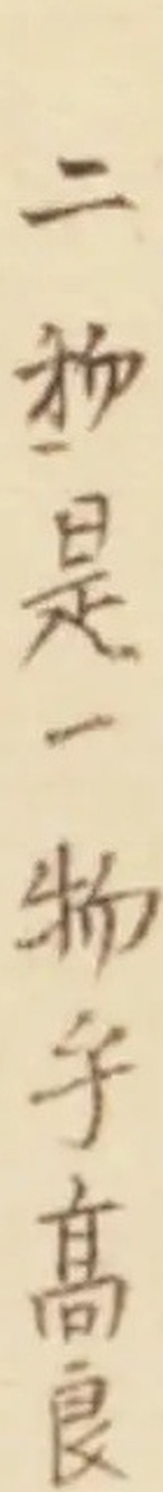二物是一物乎高良薑ハ
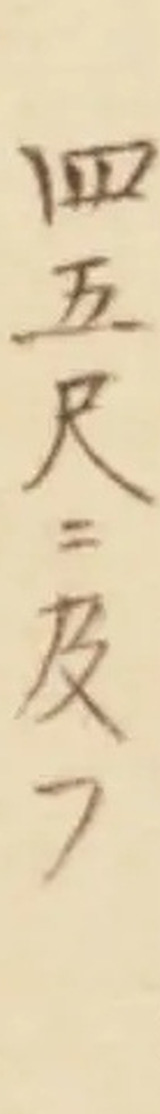四五尺ニ及フ
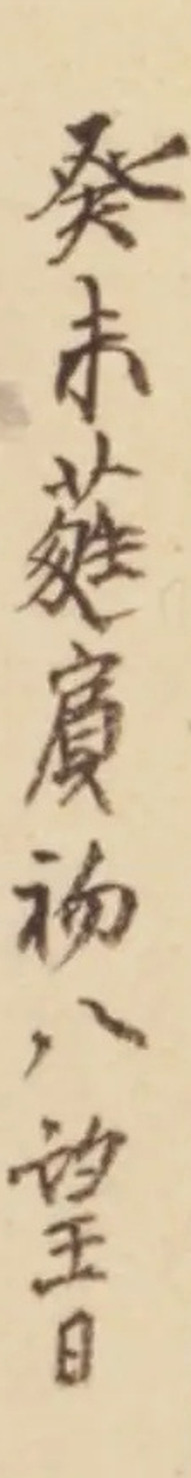癸未蕤賓初八望日

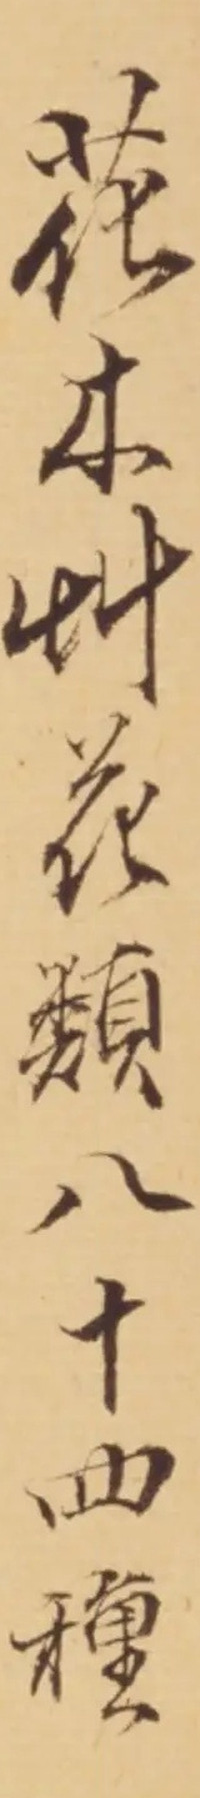花本艸花類八十四種
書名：梅園草木花譜夏之部. 1
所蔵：国立国会図書館 National Diet Library, JAPAN
